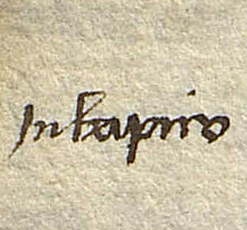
In bapiro
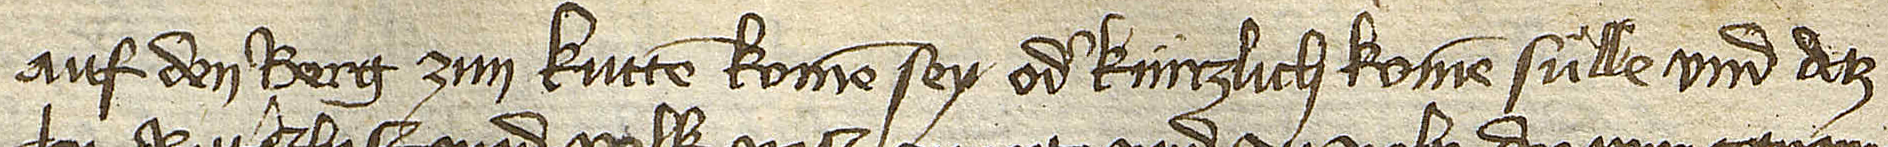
auf den Berg ʒun kutte* kome* ſey od* kürcʒlich kome* ſülle vnd daʒ
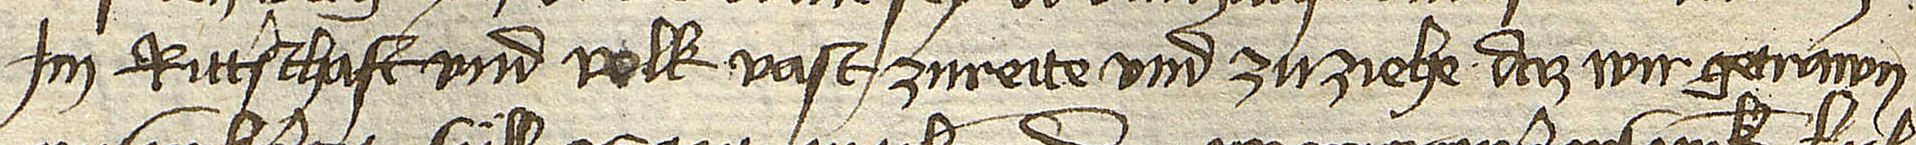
Im Ritt*ſchaft vnd volk vaſt ʒureite vnd ʒu ʒiehe . daʒ wir getrawn
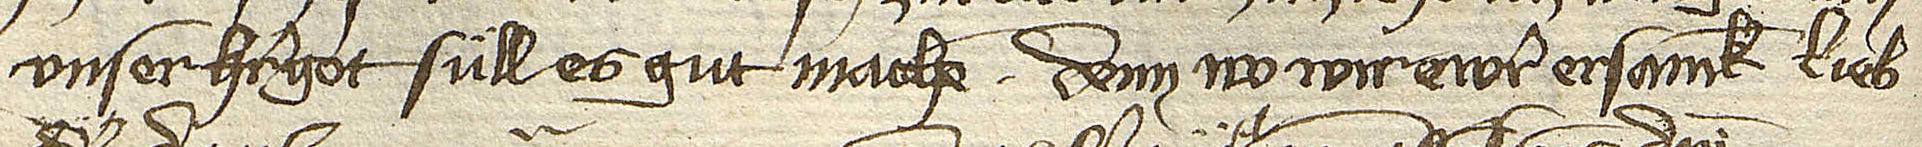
vnſer hr*got ſüll es gut mache* / Denn wo wir ewr* erſamk* lieb
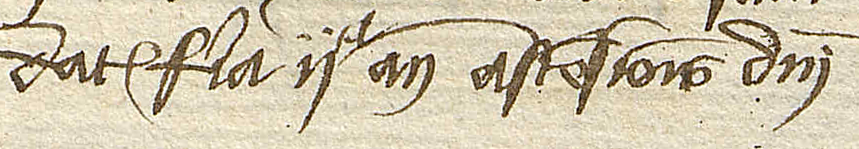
Dat* fi*a ii* an* aſce*ſioi*s dni*
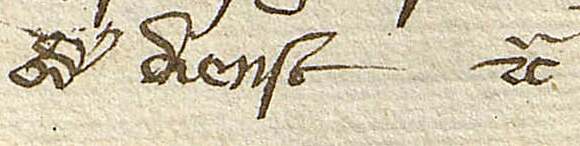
od* dienſt ec*
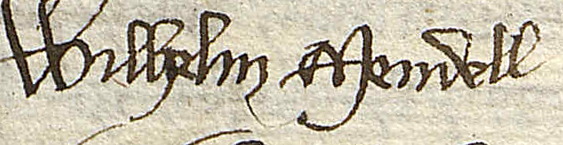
Wilhelm Mendell
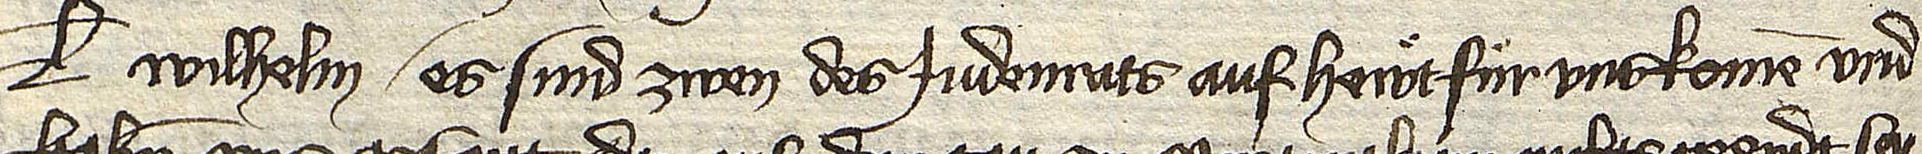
L* wilhelm / es ſind ʒwen des Iudenrats auf heẅt für vns kome* vnd
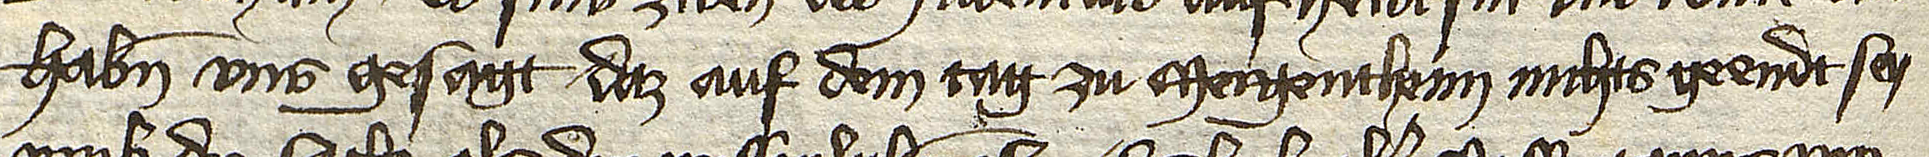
habn* vns geſagt / daʒ auf dem tag ʒu Mergentheim nichts geendt ſey
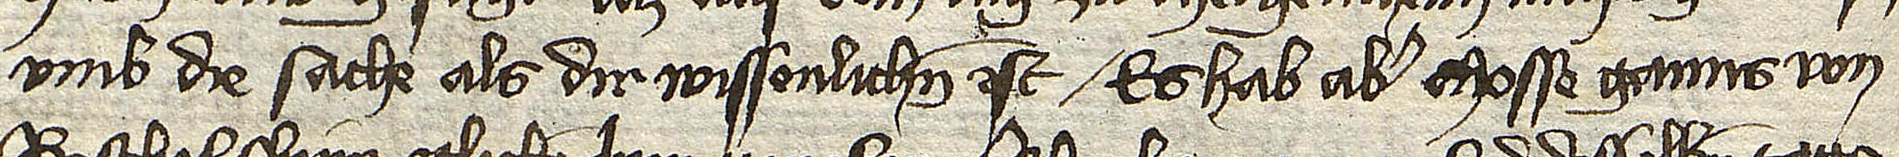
vmb die ſache als dir wiſſenlichn* iſt / Es hab ab* Moſſe ganns von
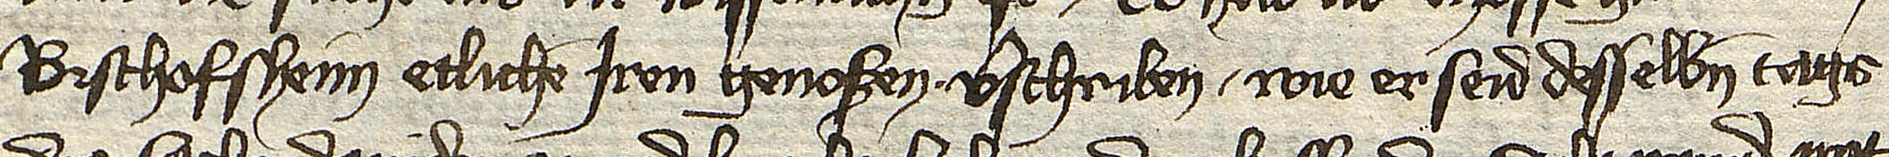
Biſchofſheim etliche* Iren genoſʒen . v*ſchriben / wie er ſeid deſſelbn* tags
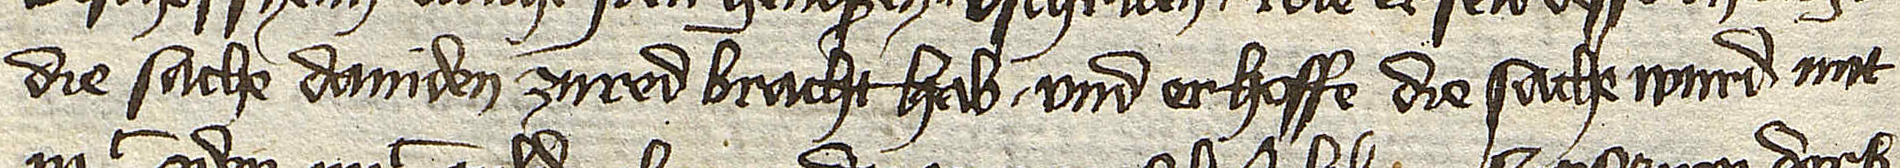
die ſache daniden ʒured bracht hab / vnd er hoffe die ſache wurd* mit
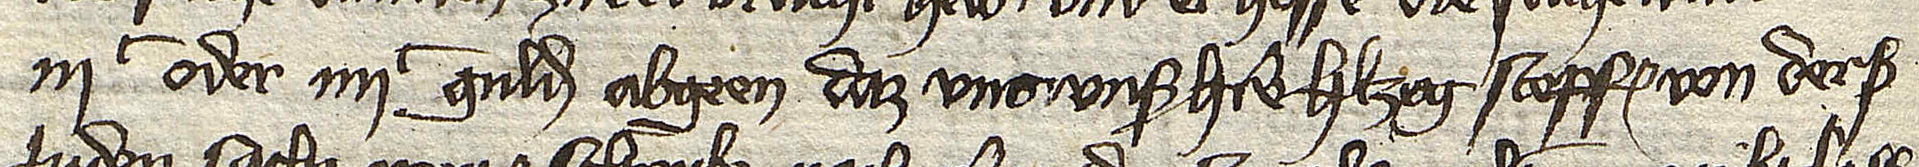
iii* oder iiii* guld* abgeen daʒ vns vnſ* h*re h*cʒog ſtepf* von derſ*
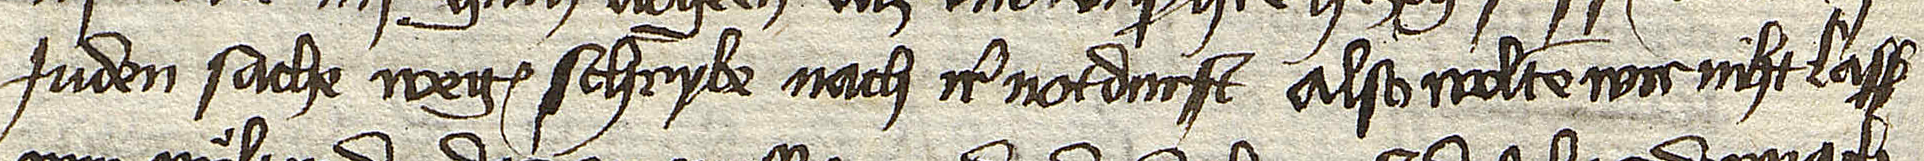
Iuden ſache weg* ſchrybe nach ir* notdurft alſo wolte* wir niht laſſ*
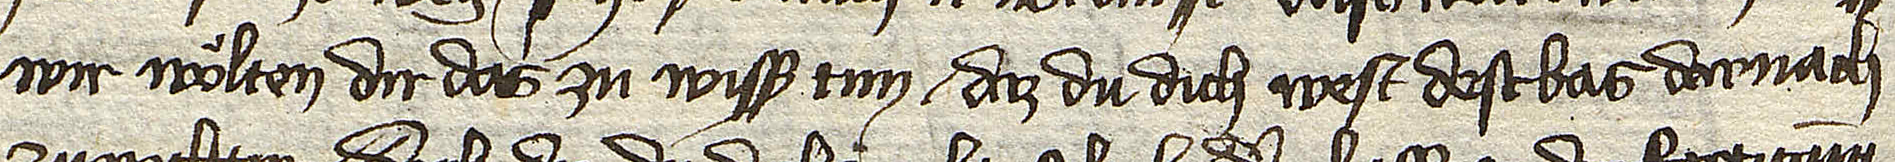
wir wölten dir das ʒu wiſſ* tun / daʒ du dich weſt deſt bas darnach
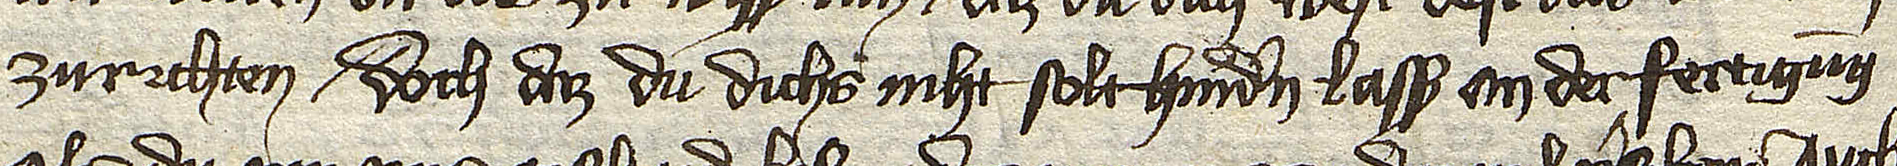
ʒurichten / Doch daʒ du dichs niht ſolt hind*n laſſ* an der fertigu*g
